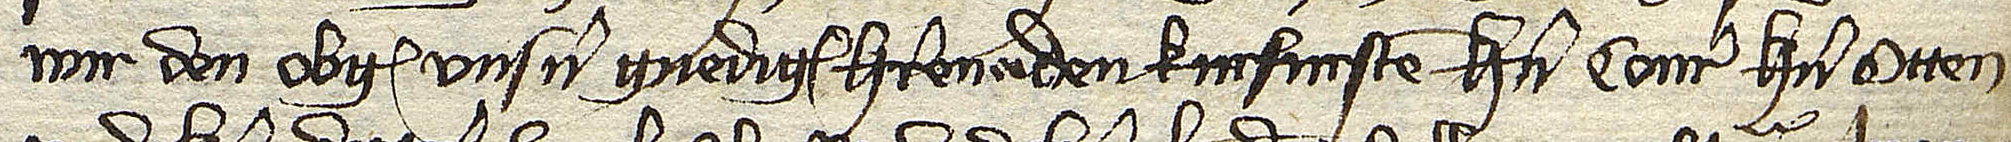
wir den obg* vnſn* gnedig* h*ren ~ den kurfurſte* hn* Conr* hn* Otten
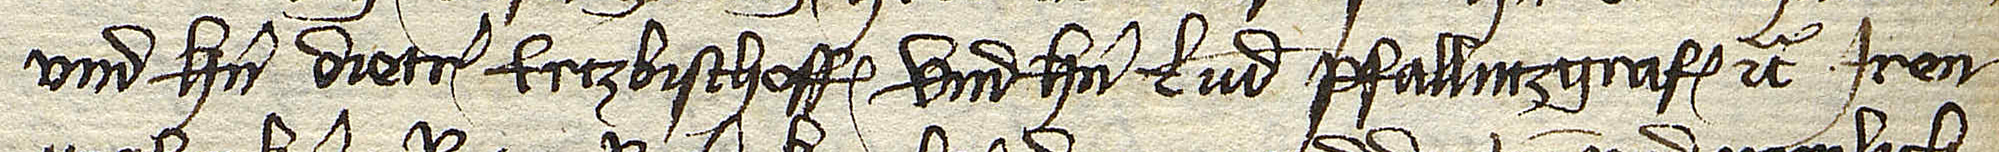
vnd hn* dietr* Ercʒbiſchoff* Vnd hn* Lud* Pfallncʒgraf* ec* . Iren
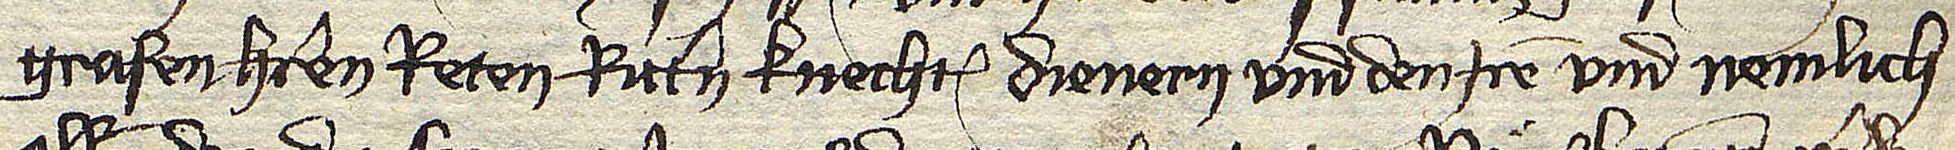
grafen h*ren Reten Ritt*n knecht* dienern vnd den Ire* vnd nemlich
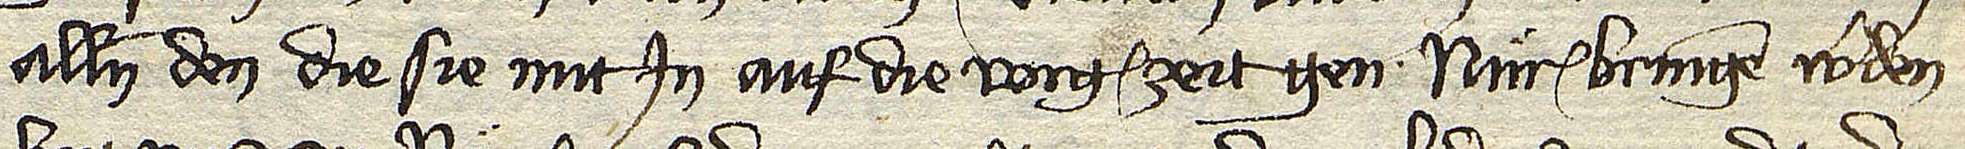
alln* den die ſie mit In auf die vorg* ʒeit gen . Nür* bringe* w*den
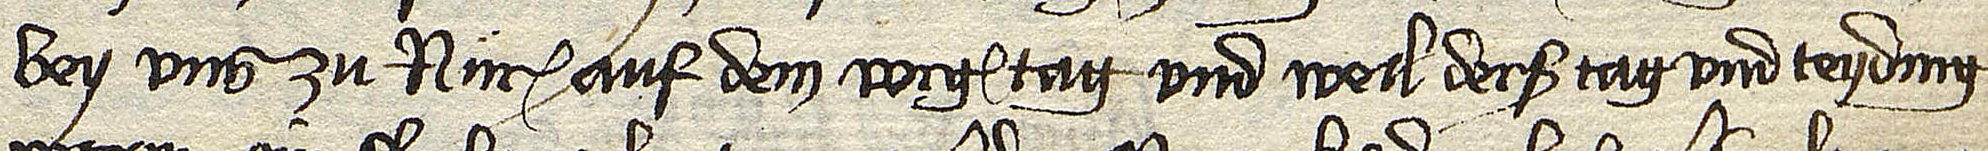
bey vns ʒu Nür* auf dem vorg* tag vnd weil derſ* tag vnd teyding
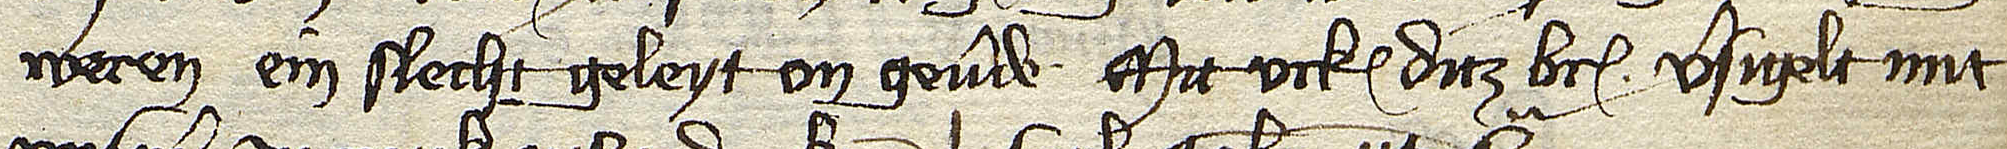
weren ein ſlecht geleyt on geu*de . Mit vrk* dicʒ br* . v*ſigelt mit
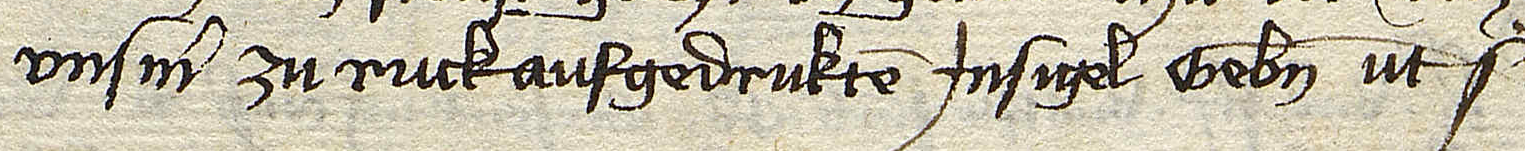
vnſm* ʒu ruck aufgedrukte* Inſigel Gebn* ut ſ*
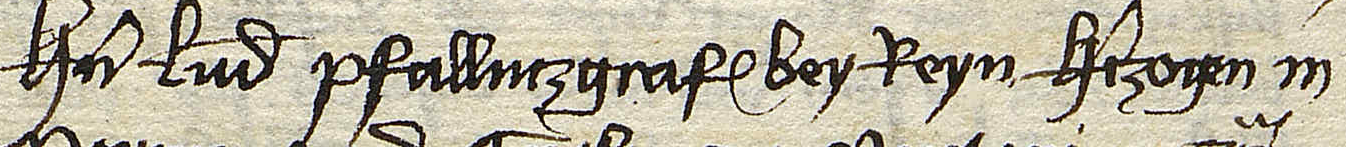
Hn* Lud* pfallncʒgraf* bey Reyn h*cʒogen in
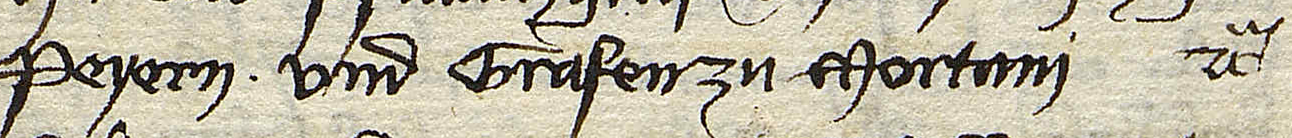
Peyern . vnd Grafen ʒu Mortani ec*
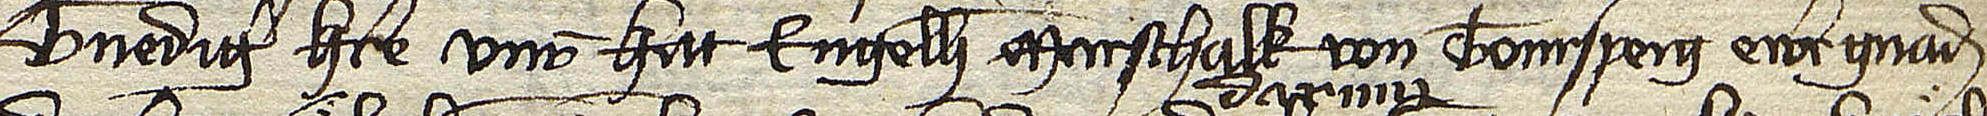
Gnedig* h*re vns hat Engelh* Marſchalk von Tonrſperg ewr* gnad*
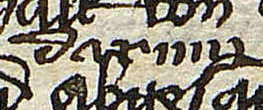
darinn
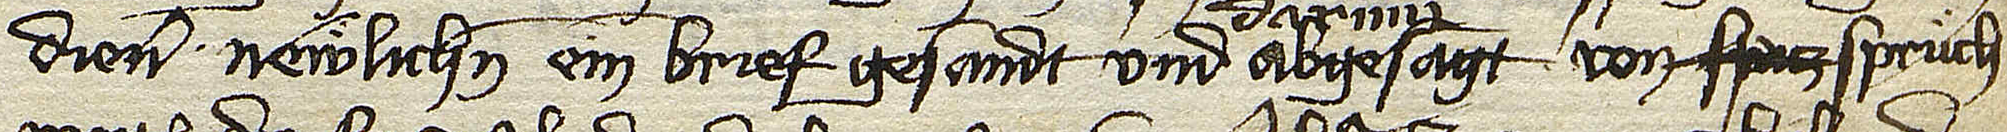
dien* newlichn* ein* biref geſandt vnd abgeſagt von %%%%% ſprüch
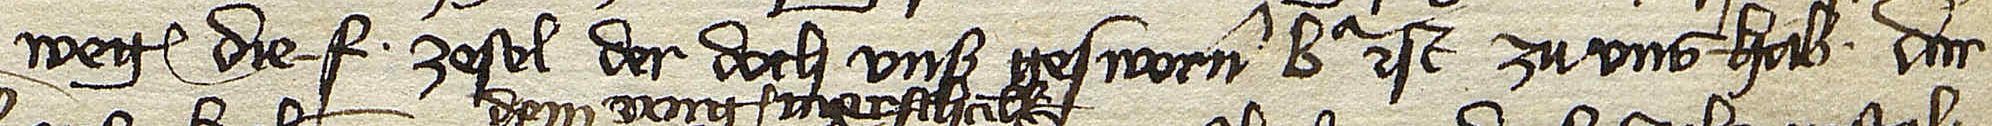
weg* die f . ʒeſel der doch vnſ* geſworn* b* iſt ʒu vns hab . Dar
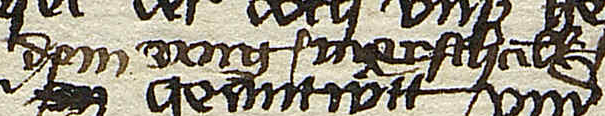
dem vorg* marſchalk
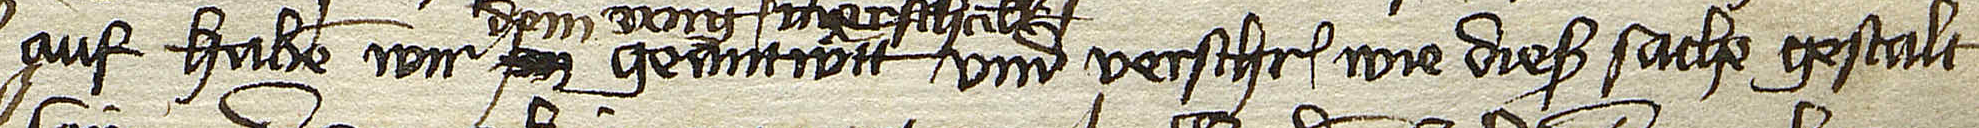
auf habe* wir Im geantw*tt vnd verſchr* wie dieſ* ſache geſtalt
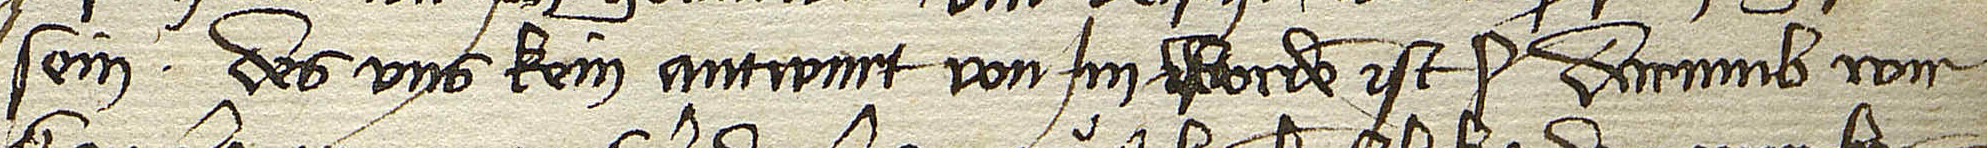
ſein . Des vns kein antwurt von Im worde* iſt / Darumb wir
